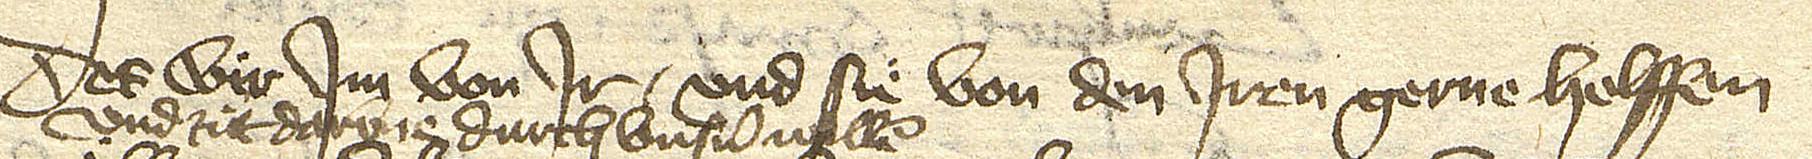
Des wir Im von Ir / vnd ſie von den Iren gerne helffen
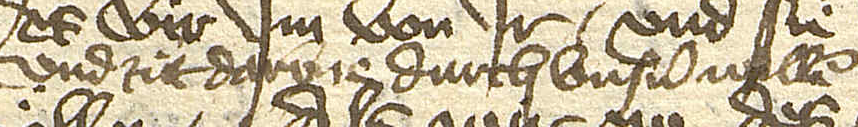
vnd tüt daryne* durch vnſn* wille*
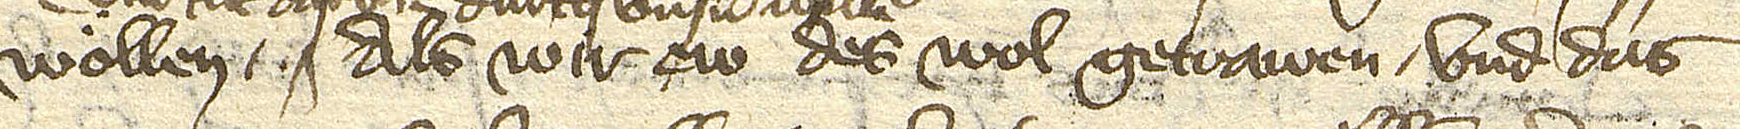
wöllen / . Als wir ew des wol getrawen / vnd das
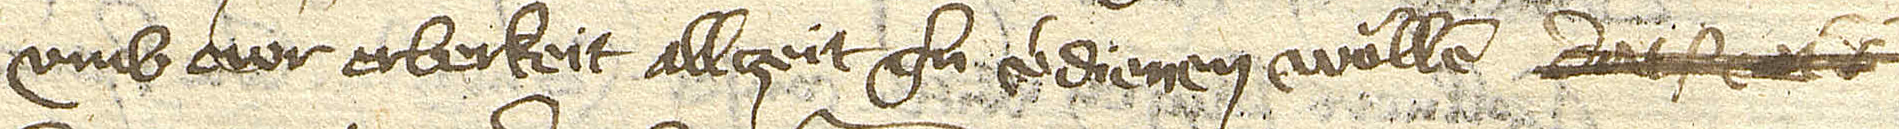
vmb ewr erberkeit allcʒeit gn* v*dienen wölle* dat* vt s*
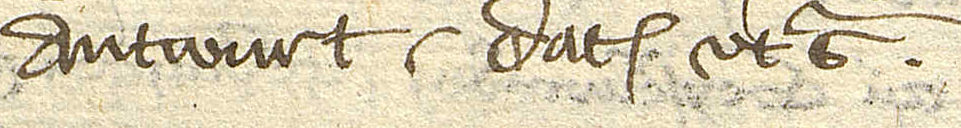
Antwurt / Dat* vt s* .
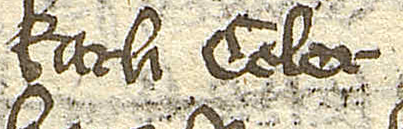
kar%% Coler
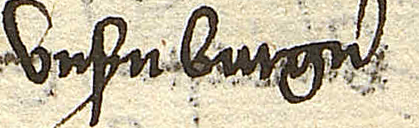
vnſ*n burgn*
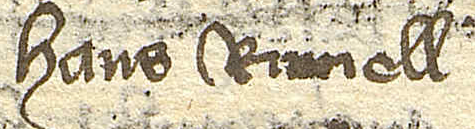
hans Rumell
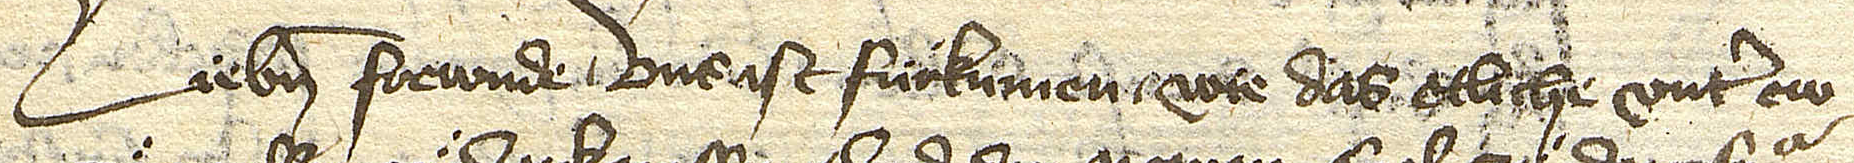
Liebn* frewnde / Vns iſt fürkumen / wie das etliche vnt* ew
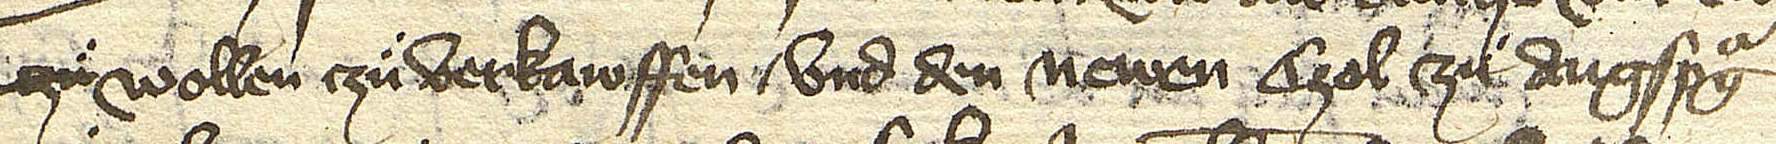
cʒü wollen cʒü verkawffen / vnd den newen Cʒol cʒü Augſp*g
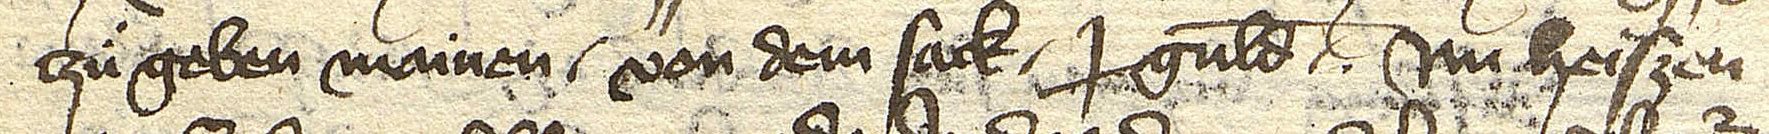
cʒü geben mainen / von dem ſack / I* guld* /. Nu heiſʒen
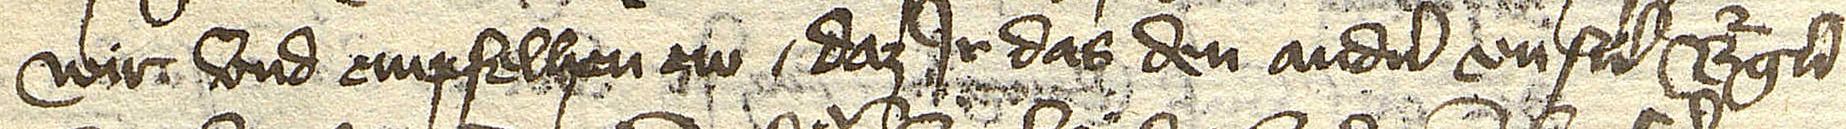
wir vnd empfelhen ew / daʒ Ir das den andn* vnſ*n B*gn*
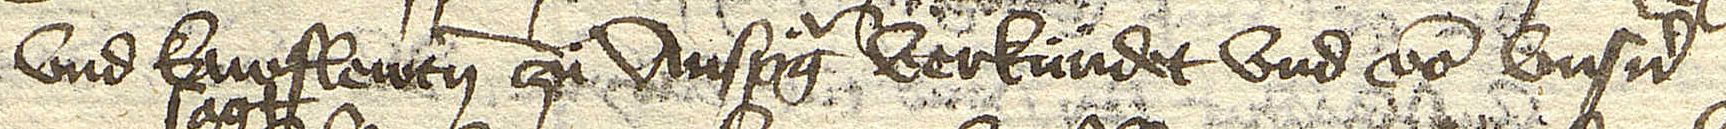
vnd kawflewtn* cʒü Auſp*g verkündet vnd vo* vnſn*
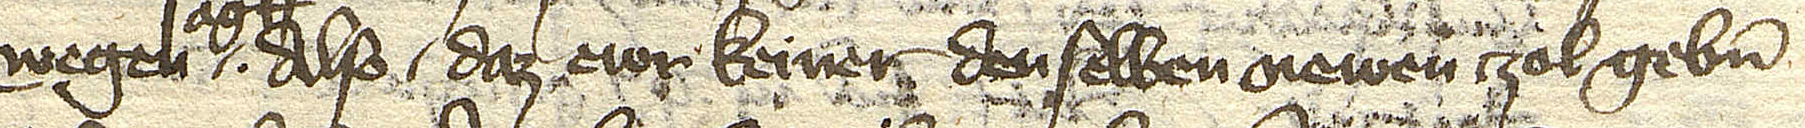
wegen /. Alſo / daʒ ewr keiner denſelben newen cʒol gebn*
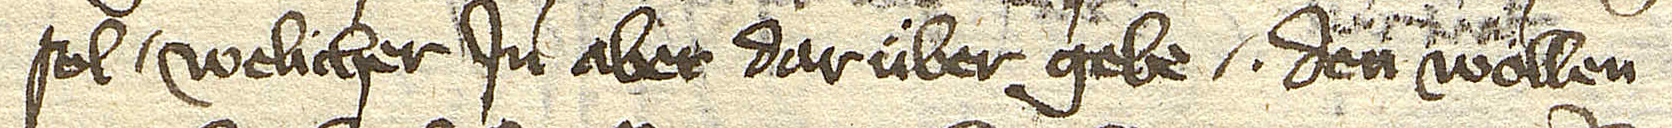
ſol / welicher In aber darüber gebe /. Den wöllen
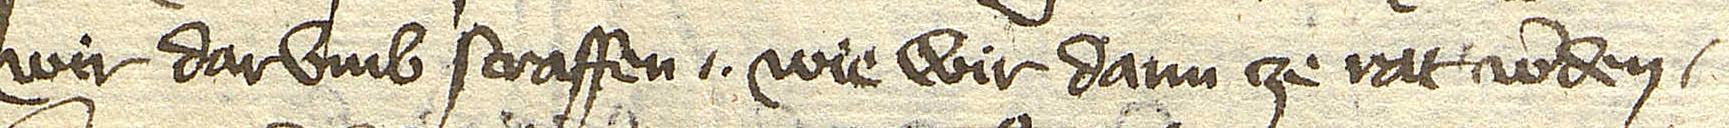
wir darvmb ſtraffen /. wie wir dann cʒe rat w*den /
